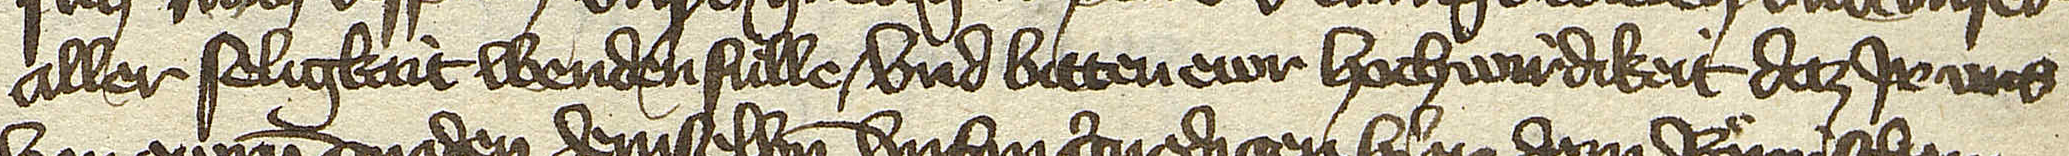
aller ſeligkeit wenden ſülle / vnd bitten ewr hochwirdikeit daʒ Ir vns
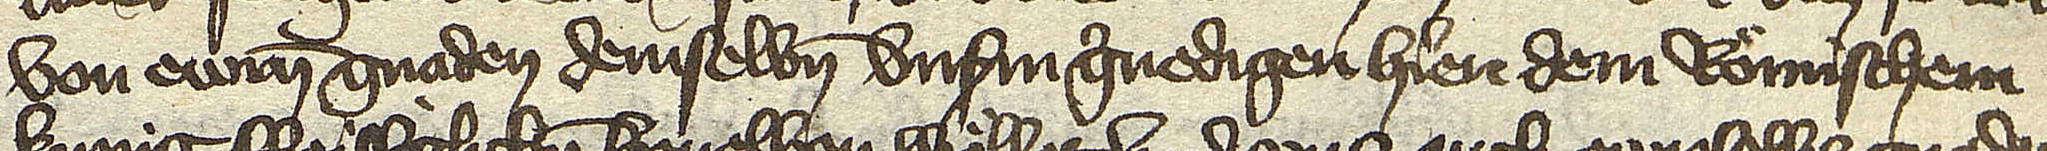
von ewrn* gnaden demſelbn* vnſ*m gnedigen he*rn dem Römiſchem
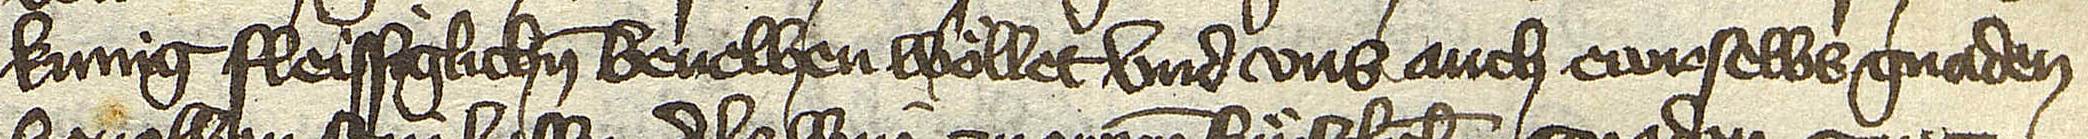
kunig fleiſſiglichn* beuelhen wöllet vnd vns auch ewrſelbs gnaden
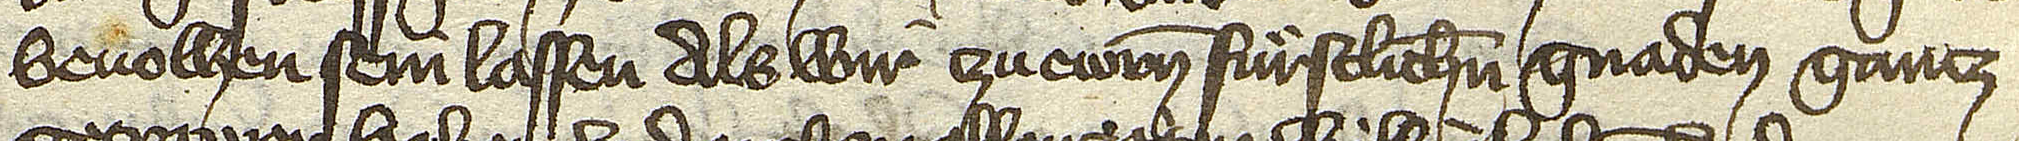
beuolhen ſein laſſen Als wir cʒu ewrn* fürſtlichn* gnaden gancʒ
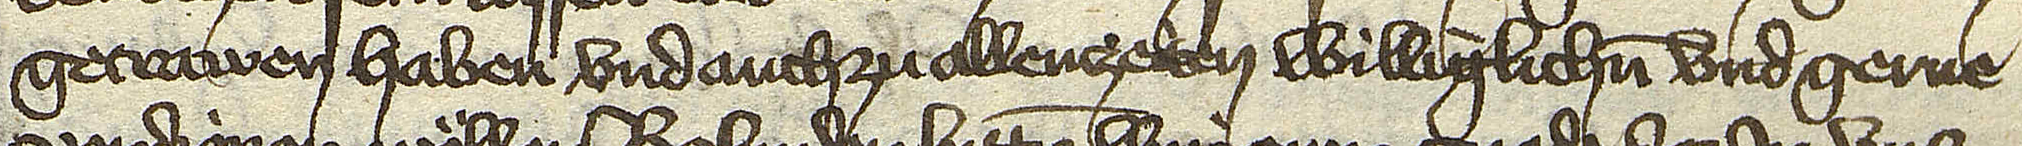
getrawen haben vnd auch cʒu allencʒeiten williglichn* vnd gerne
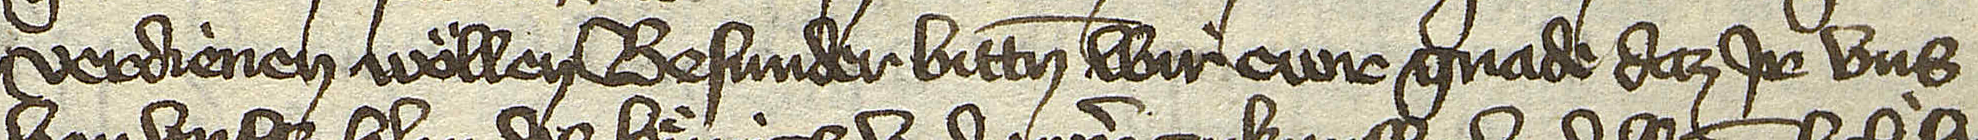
verdienen wöllen Beſunder bittn* wir ewr gnade daʒ Ir vns
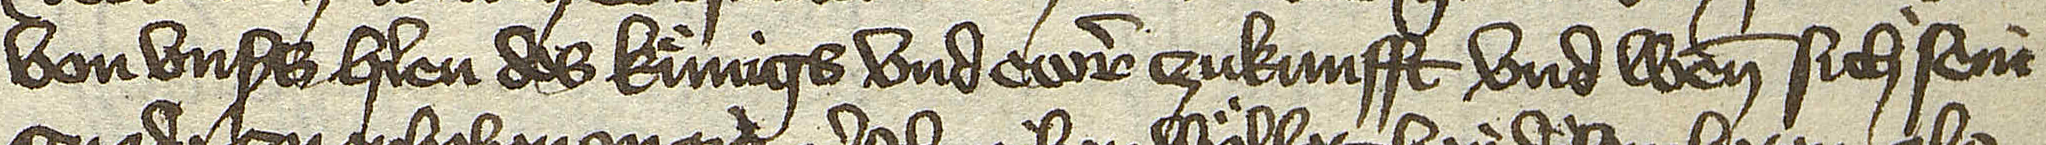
von vnſ*s hr*en des künigs vnd ewr* cʒukunfft vnd wen* ſich ſein
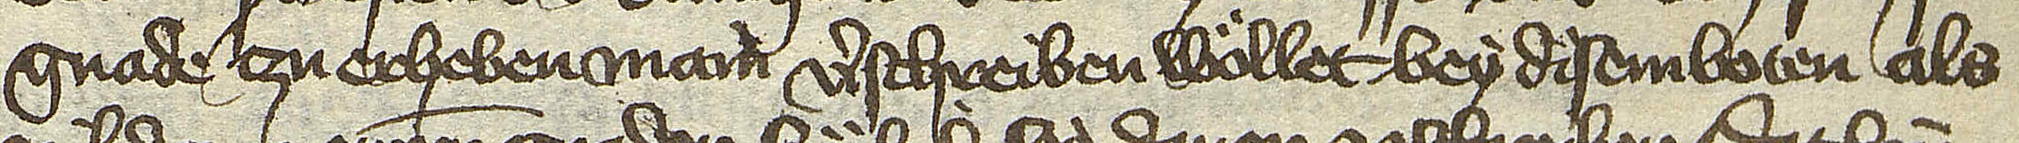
gnade cʒu erheben main v*ſchreiben wöllet / bey diſem boten als
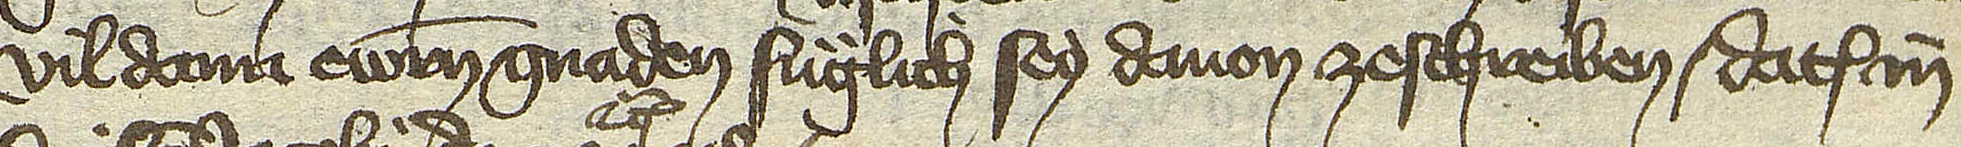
vil dann ewrn* gnaden füglich ſey dauon cʒeſchreiben / dat* iii*
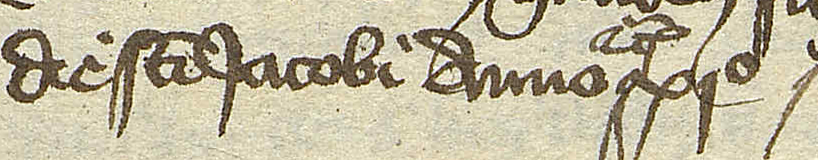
die ſci* Iacobi Anno xi* /
